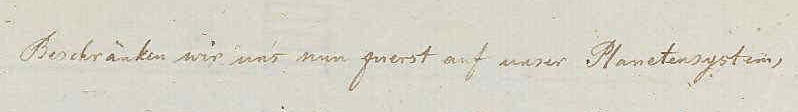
Beschränken wir uns nun zuerst auf unser Planetensystem,
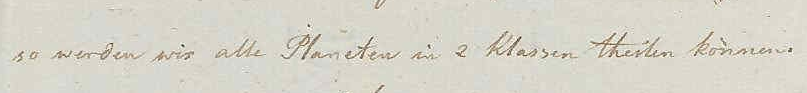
so werden wir alle Planeten in 2 Klassen theilen können:
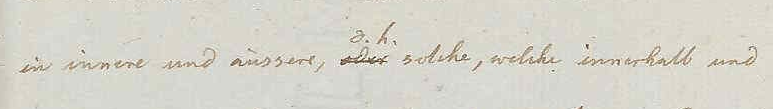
in innere und äussere, oderd. h. solche, welche innerhalb und
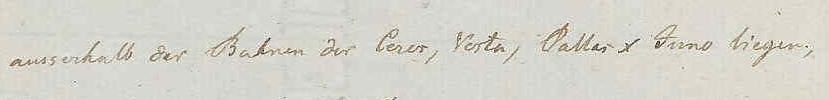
ausserhalb der Bahnen der Ceres, Vesta, Pallas & Juno liegen,
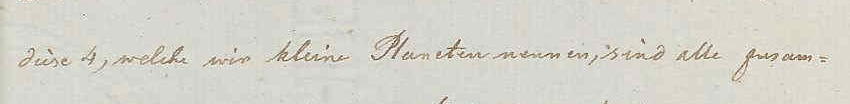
diese 4, welche wir kleine Planeten nennen, sind alle zusam-
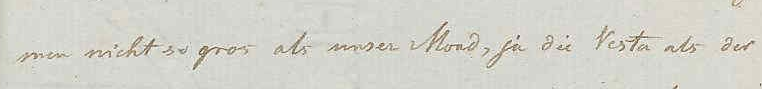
men nicht so gros als unser Mond, ja die Vesta als der
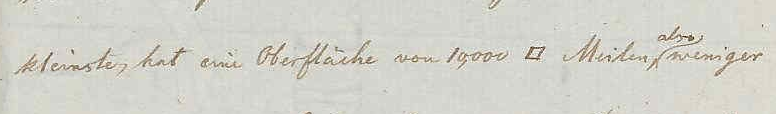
kleinste, hat eine Oberfläche von 10,000 □ Meilen, also weniger
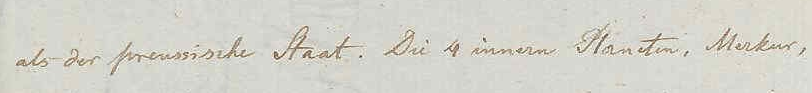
als der preussische Staat. Die 4 innern Planeten, Merkur,
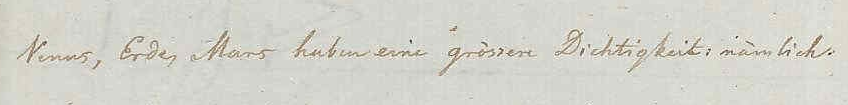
Venus, Erde, Mars haben eine grössere Dichtigkeit: nämlich:
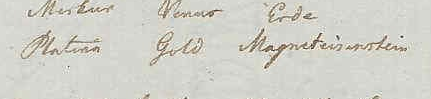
PlatinGoldMagneteisenstein
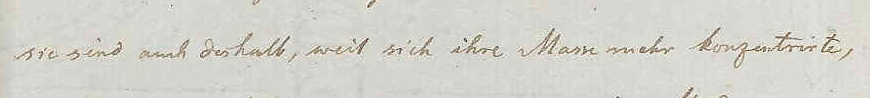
sie sind auch deshalb, weil sich ihre Masse mehr konzentrirte,
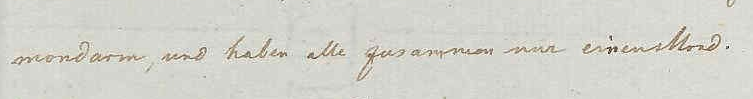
mondarm, und haben alle zusammen nur einen Mond.
